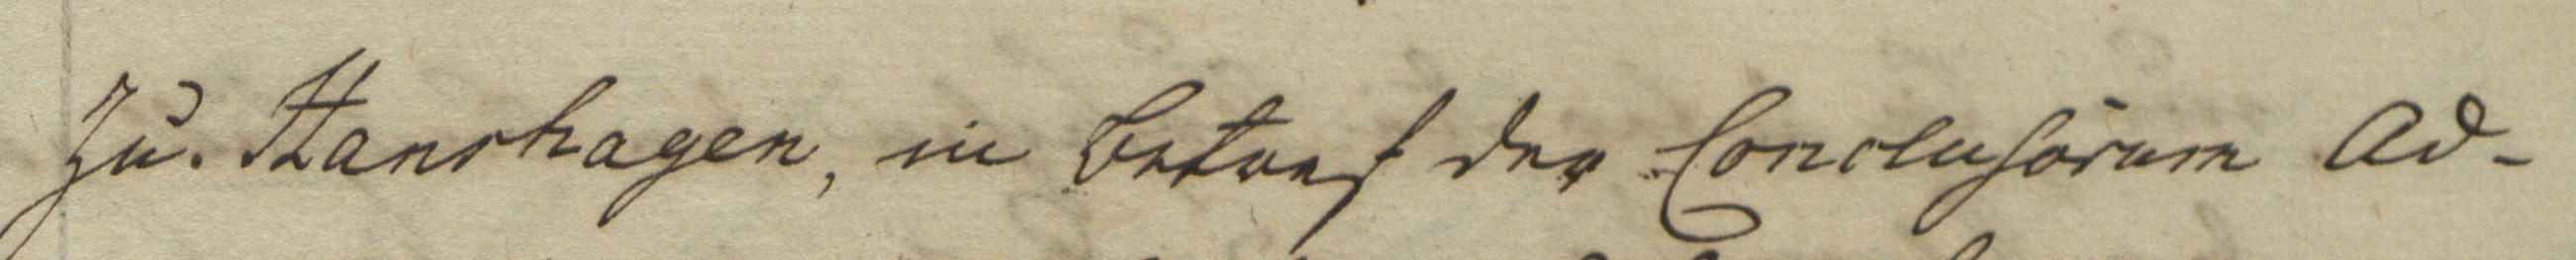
zu. Hanshagen, in Betref der Conclusorum Ad¬
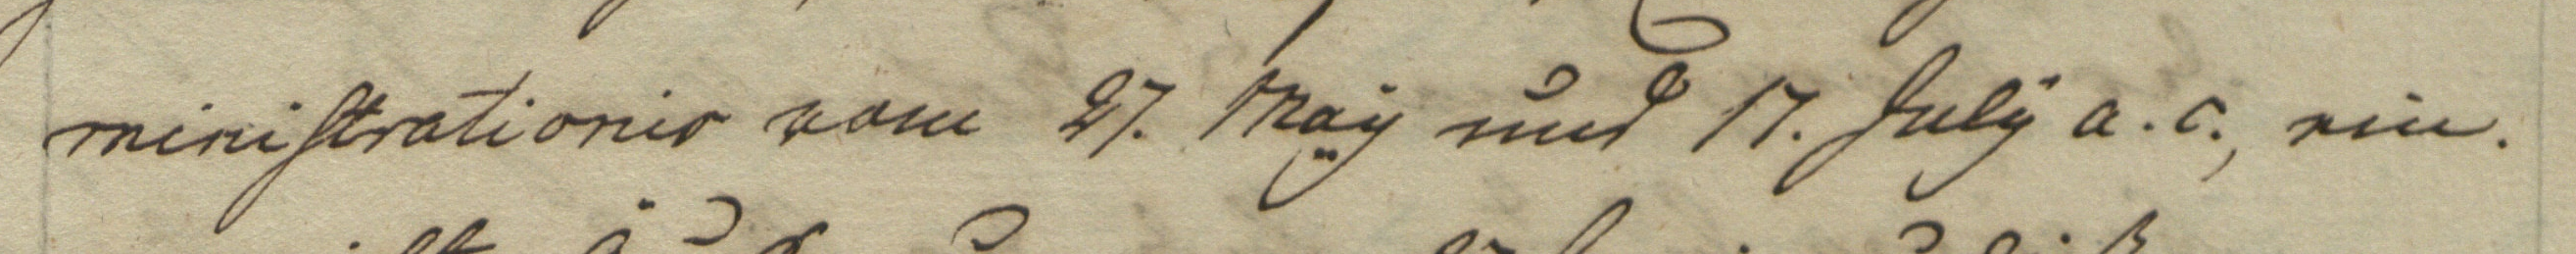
ministrationis vom 27. Maÿ und 17. Julÿ a. c. ein¬
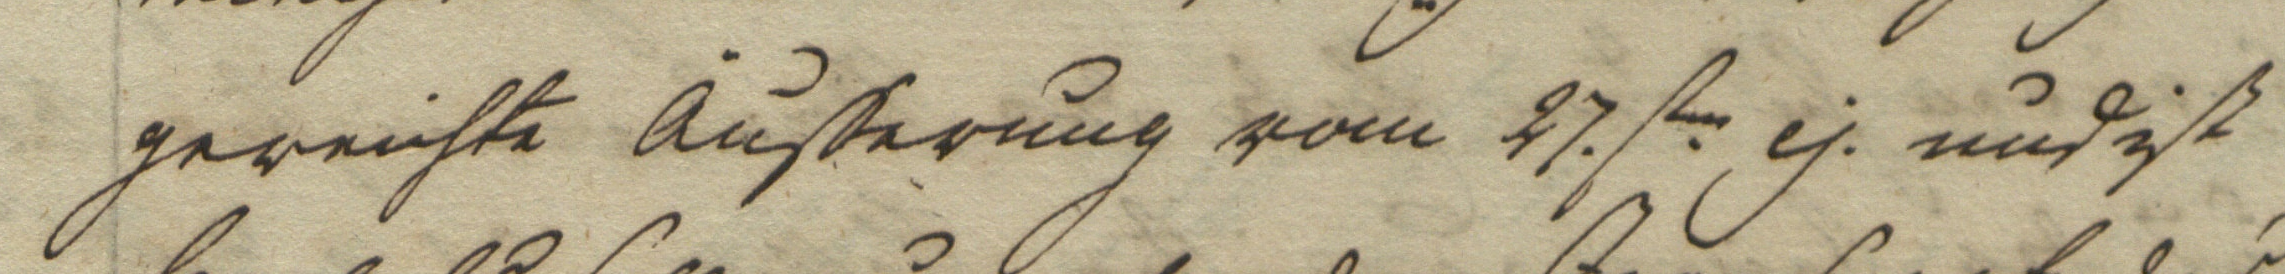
gereichte Äusserung vom 27 t. ej. und ist
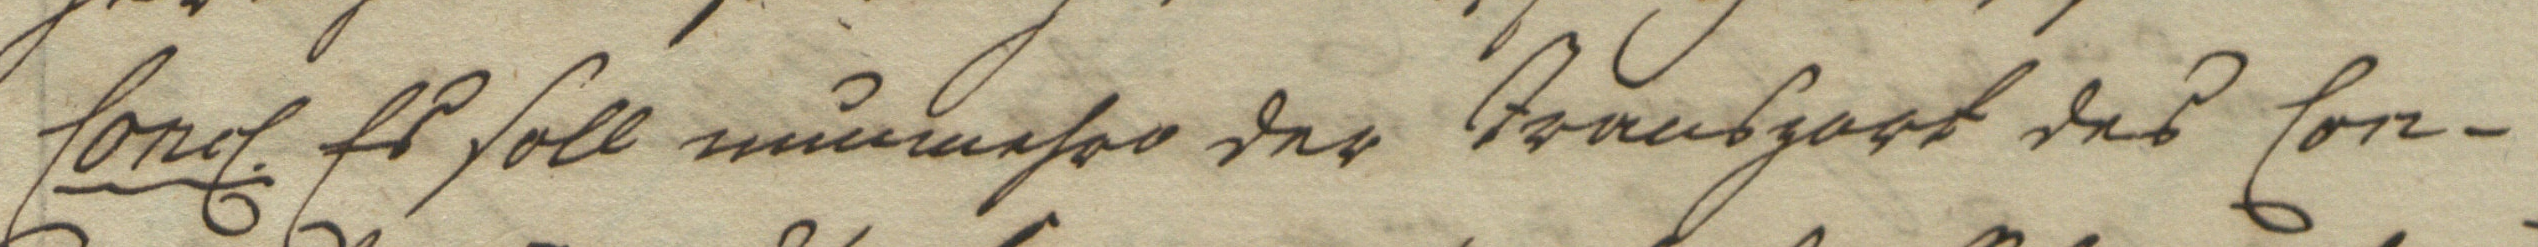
Concl. Es soll nunmehro der Transport des Con¬
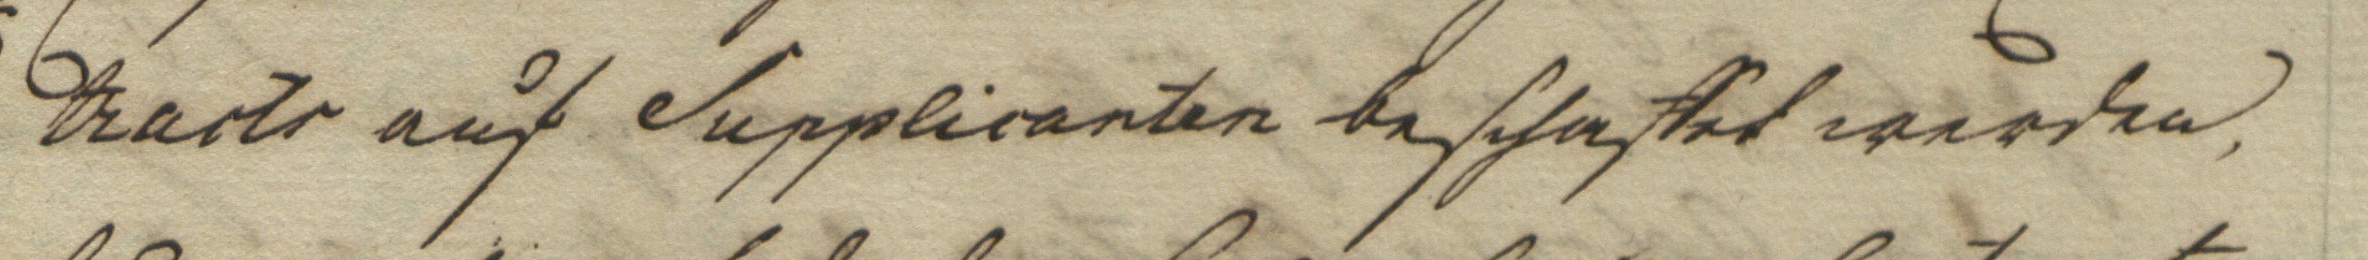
tracts auf Supplicanten beschaffet werden,
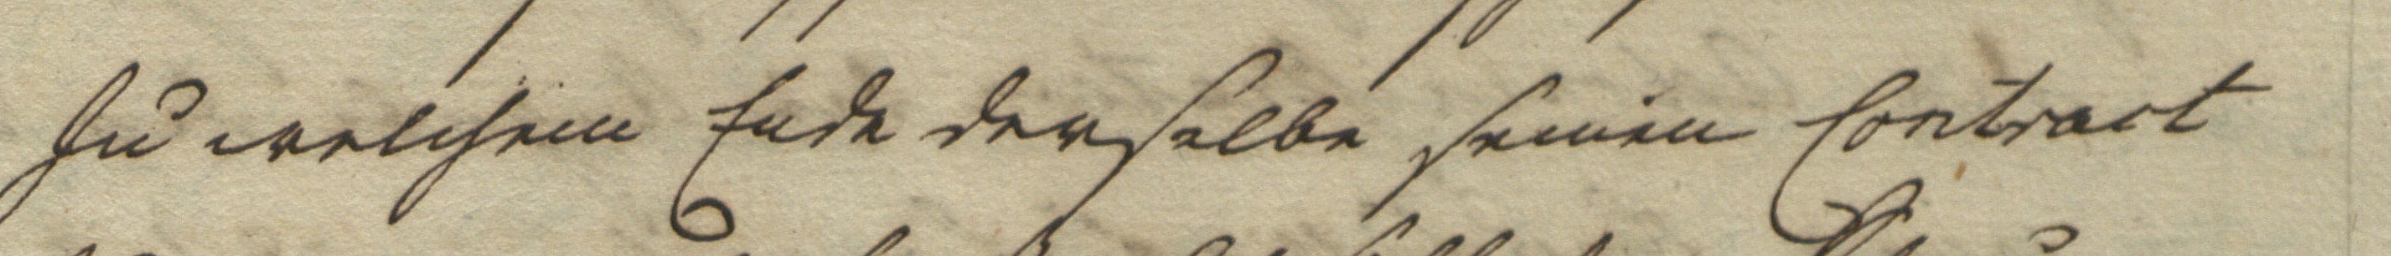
zu welchem Ende derselbe seinen Contract
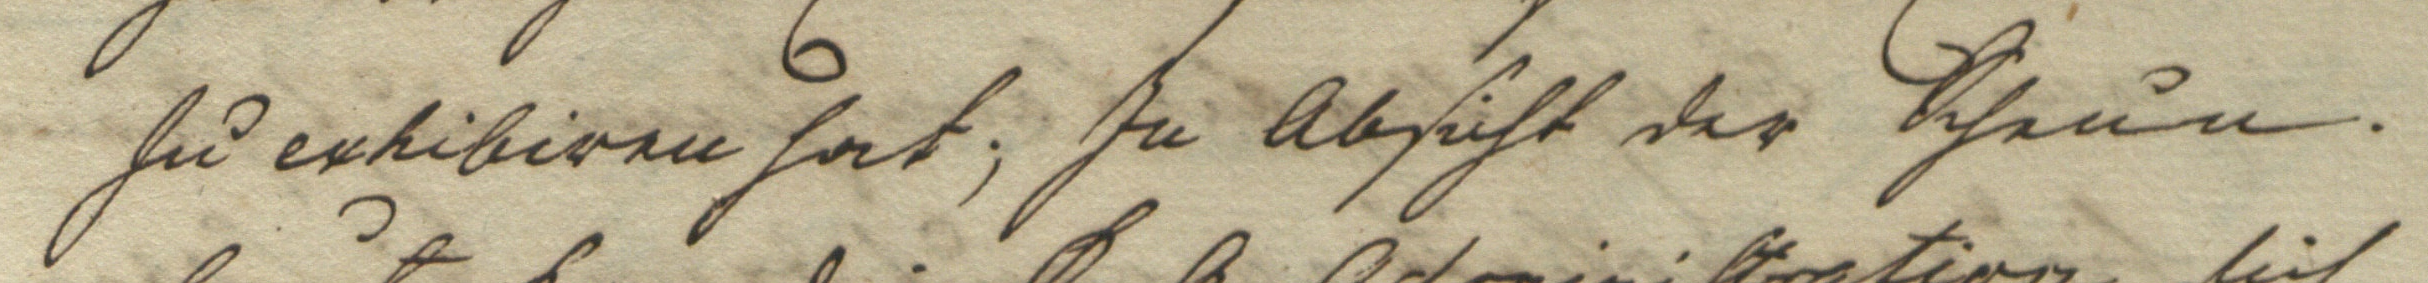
zu exhibiren hat; In Absicht der Scheun¬
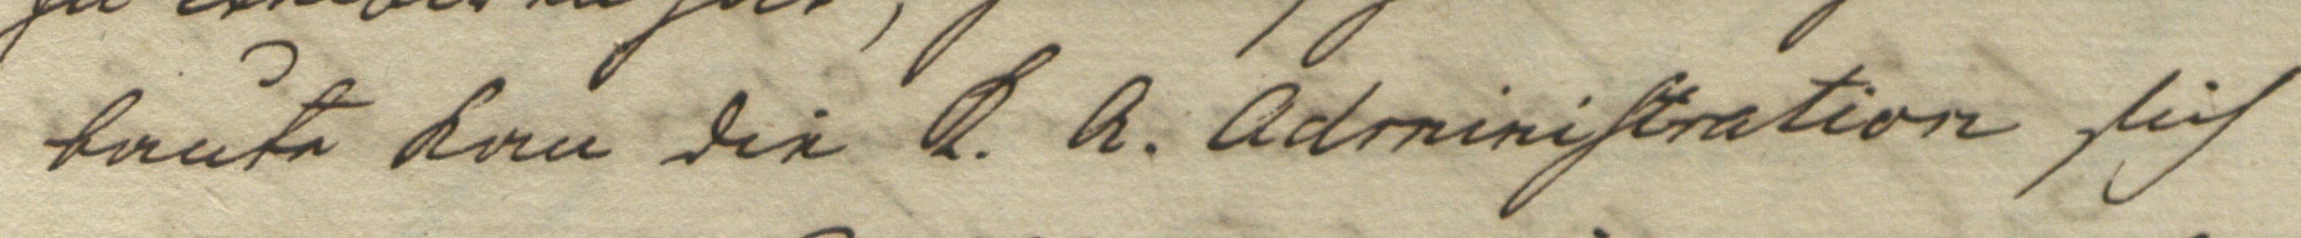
baute kan die K. A. Administration sich
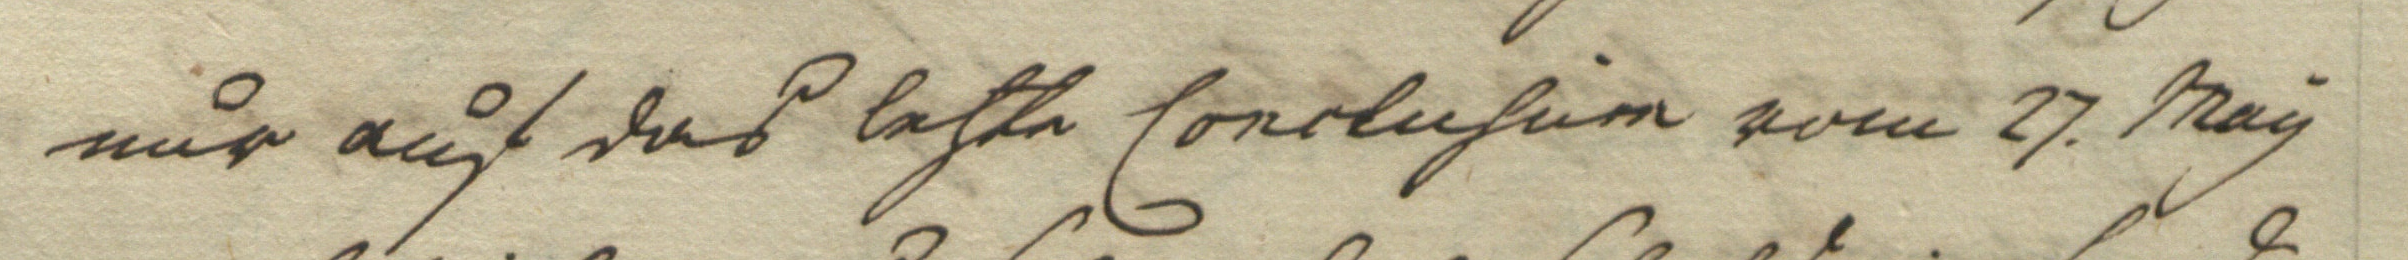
nur auf das letzte Conclusum vom 27. Maÿ
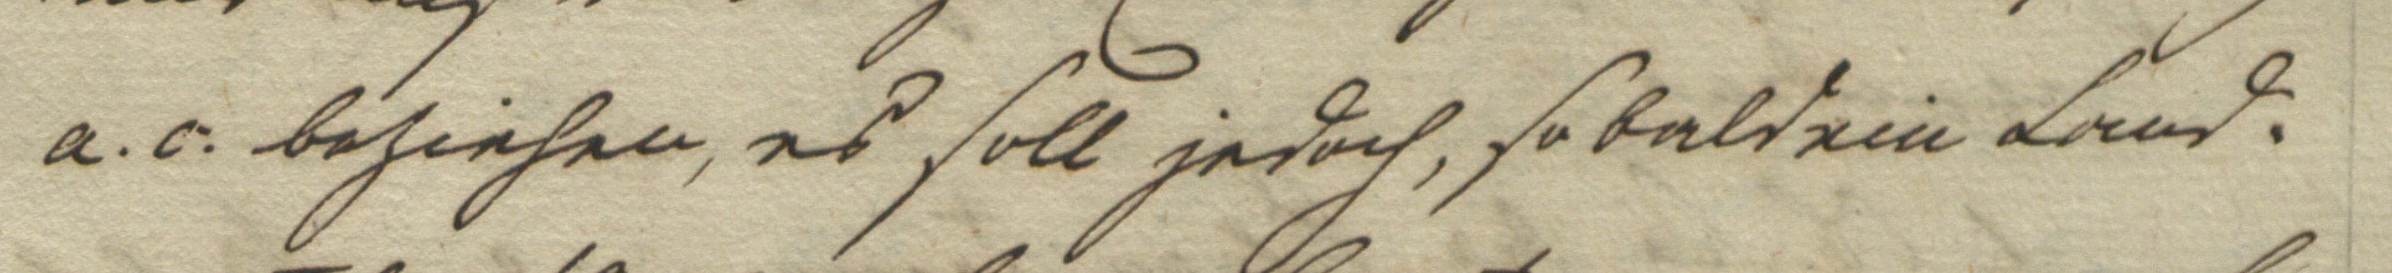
a. c. beziehen, es soll jedoch, so bald ein Land¬
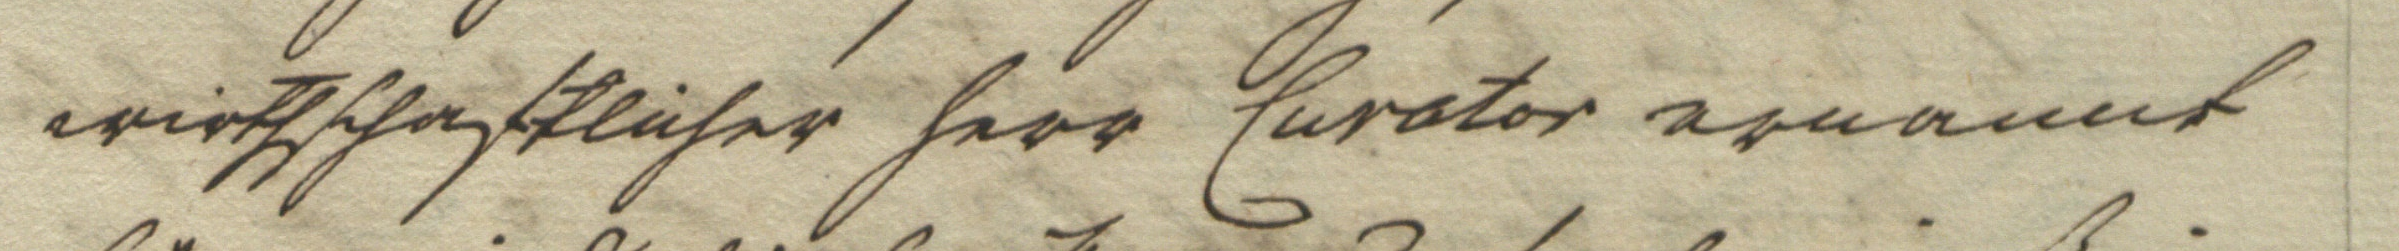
wirthschaftlicher Herr Curator ernannt
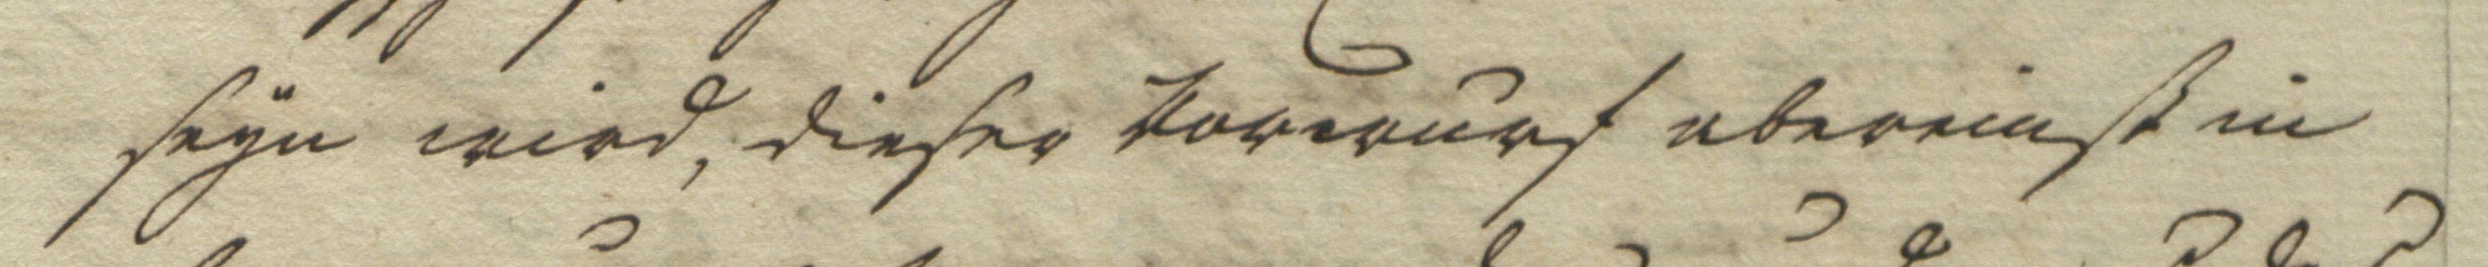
seÿn wird, dieser Vorwurf abereinst in
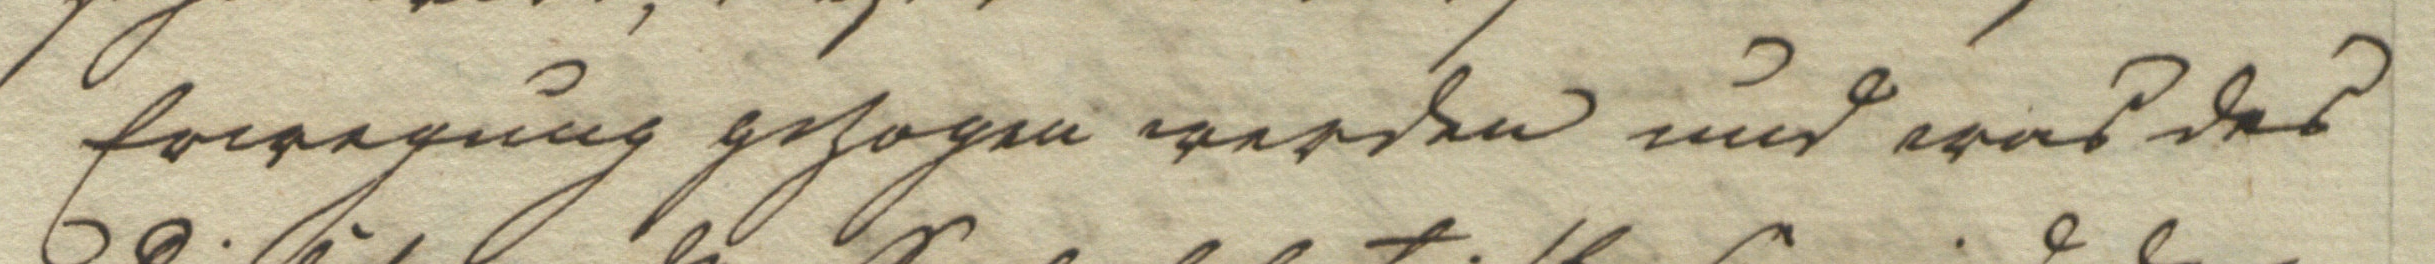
Erwegung gezogen werden und was das
